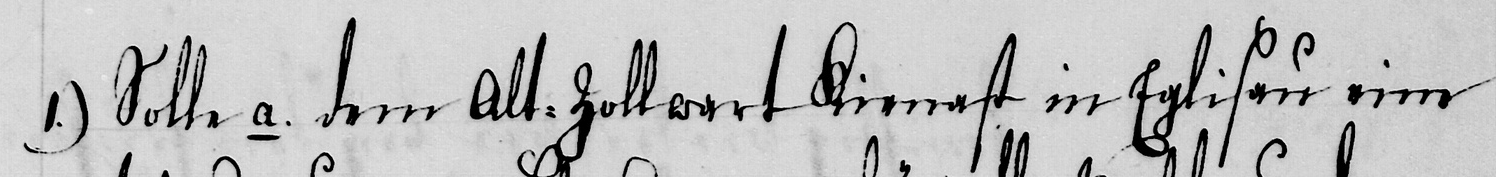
1.) Solle a. dem Alt-Zollwart Kienast in Eglisau eine
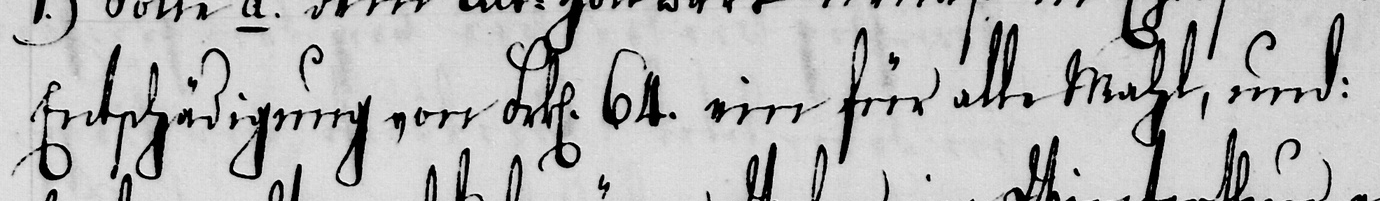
Entschädigung von Frk[en]. 64. ein für alle Mahl, und:
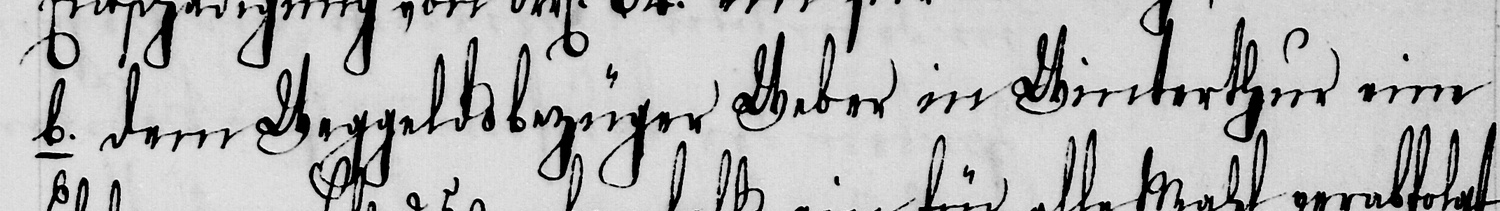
b. dem Weggeldbezüger Weber in Winterthur eine
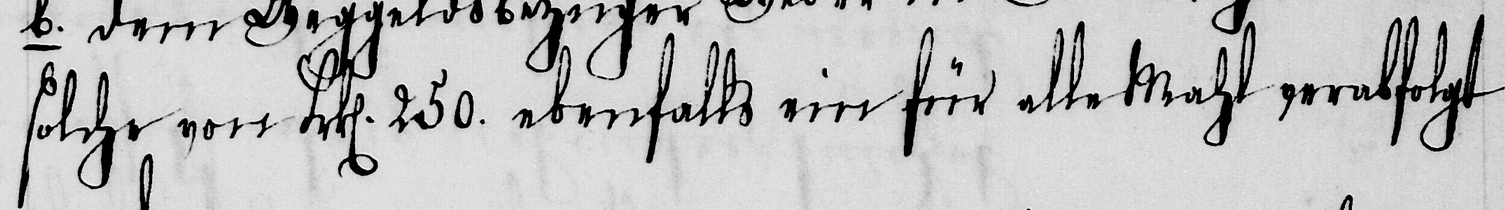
solche von Frk[en]. 250. ebenfalls ein für alle Mahl verabfolgt
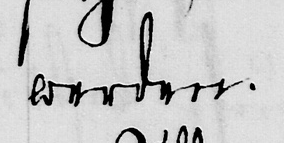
werden.
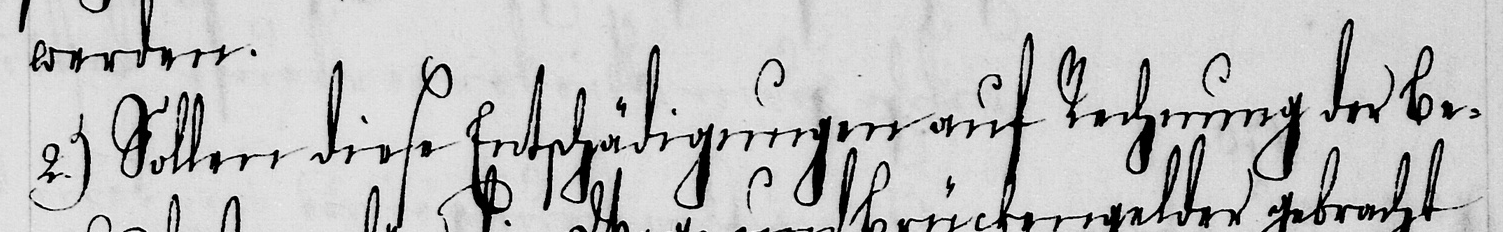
2.) Sollen diese Entschädigungen auf Rechnung der Be¬
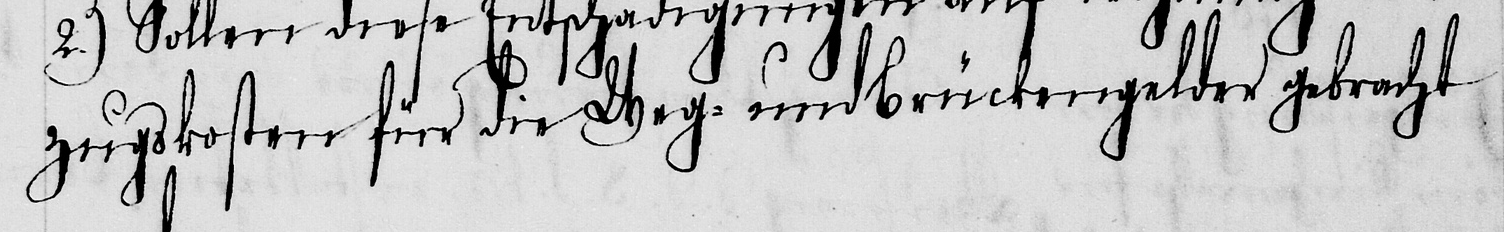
zugskosten für die Weg- und Brückengelder gebracht
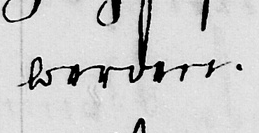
werden.
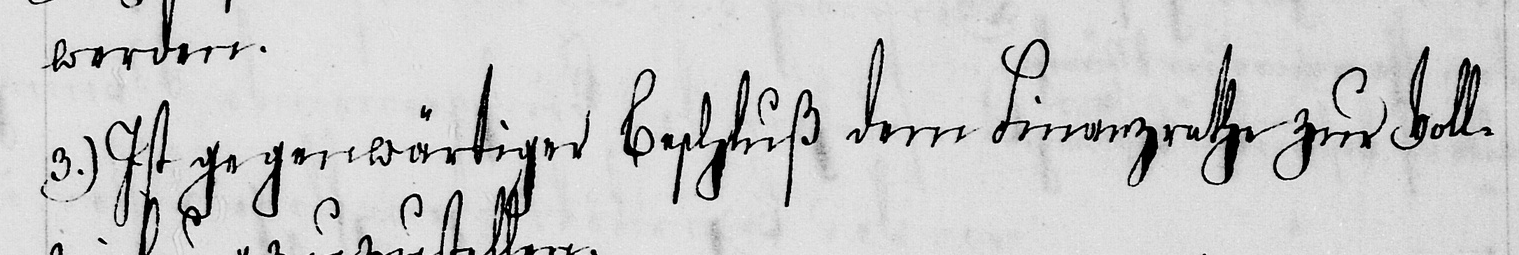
3.) Ist gegenwärtiger Beschluß dem Finanzrathe zur Vol¬
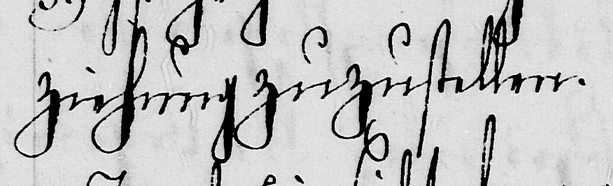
lziehung zuzustellen.
